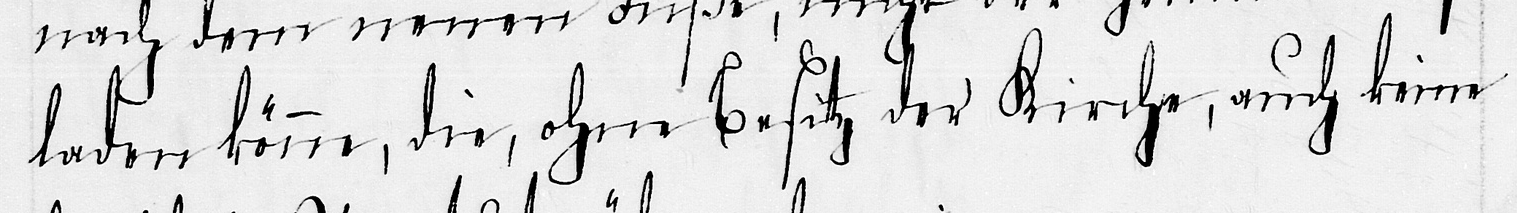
laden könne, die, ohne Besitz der Kirche, auch keine
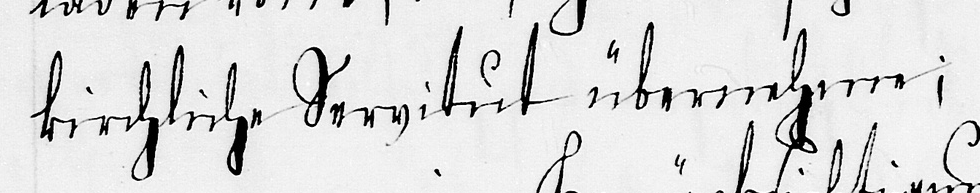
kirchliche Servitut übernehme;
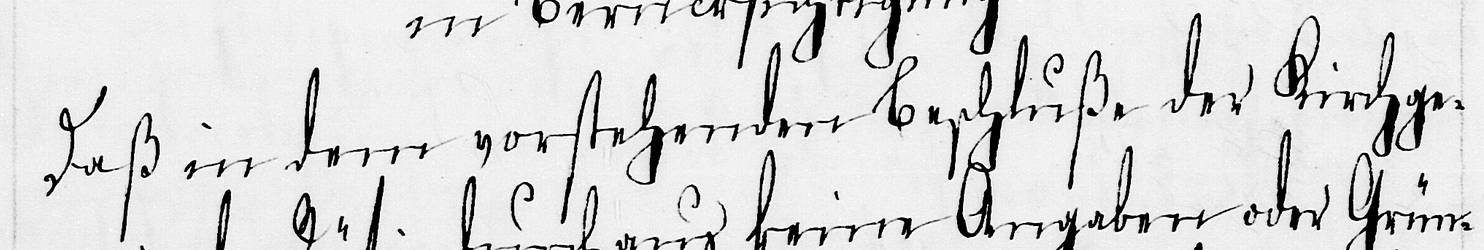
Daß in dem vorstehenden Beschluße der Kirchge¬
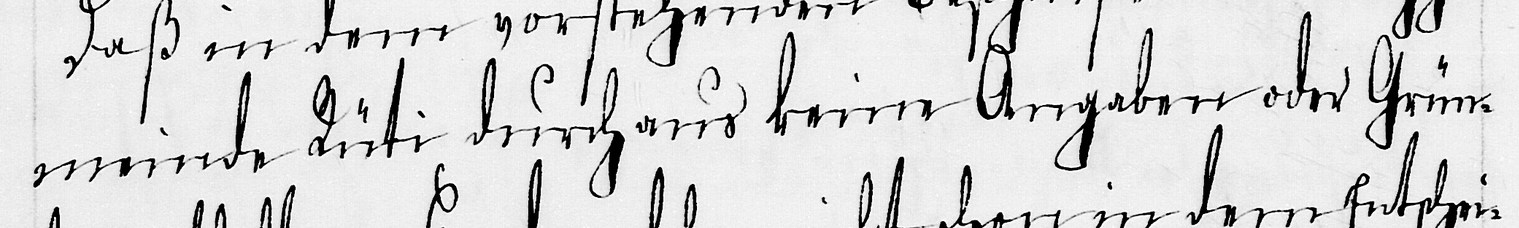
meinde Rüti durchaus keine Angaben oder Grün¬
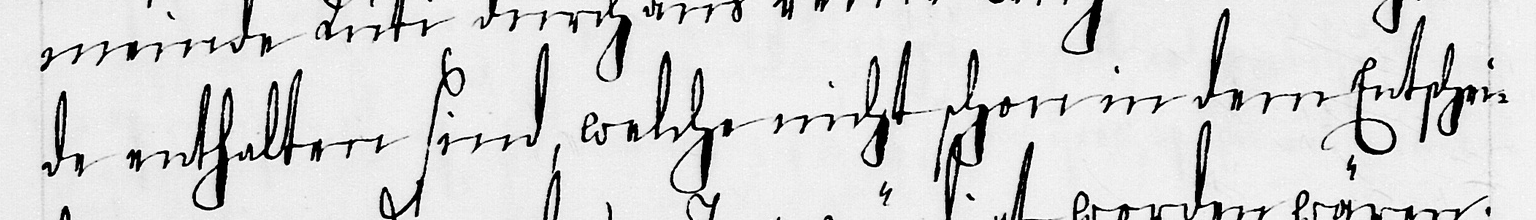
de enthalten sind, welche nicht schon in dem Entschei¬
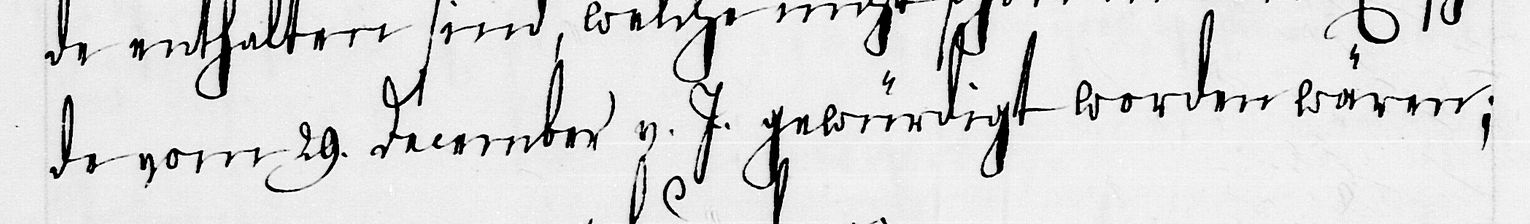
de vom 29. December v. J. gewürdigt worden wären;
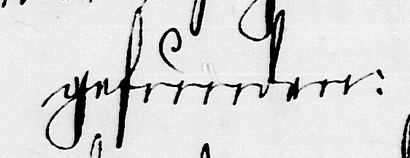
gefunden:
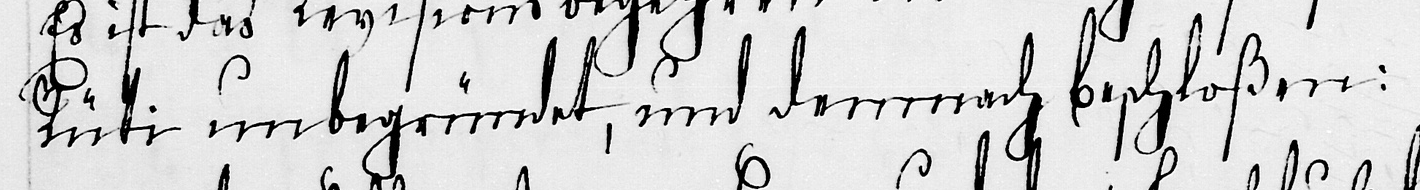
Rüti unbegründet, und demnach beschloßen:
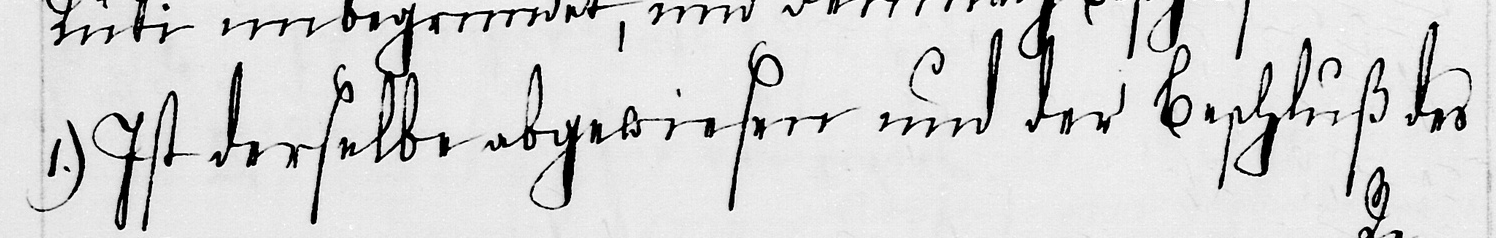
1.) Ist derselbe abgewiesen und der Beschluß des
